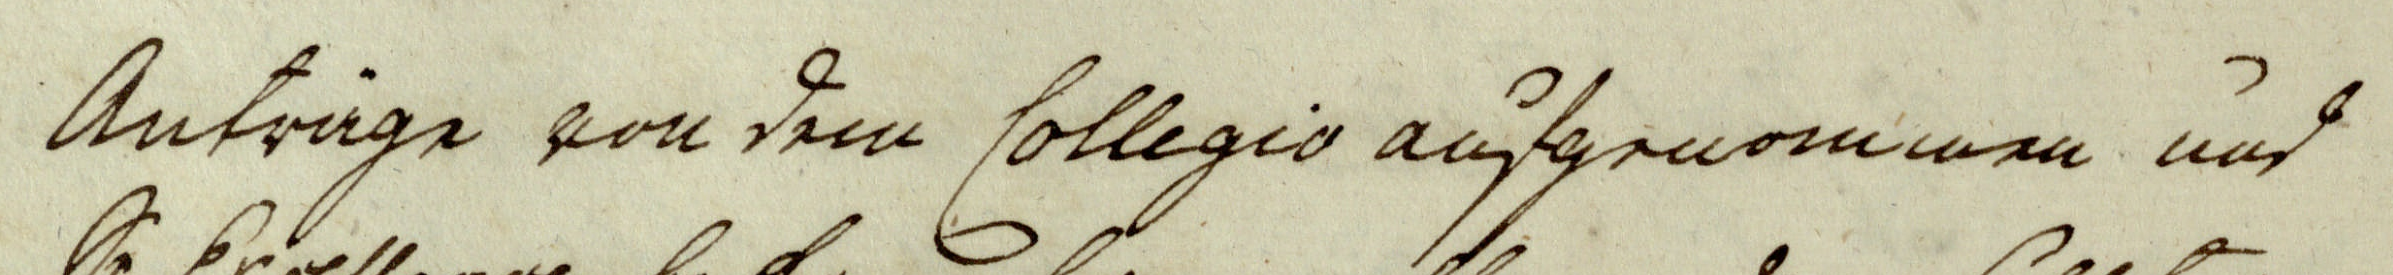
Anträge von dem Collegio aufgenommen und
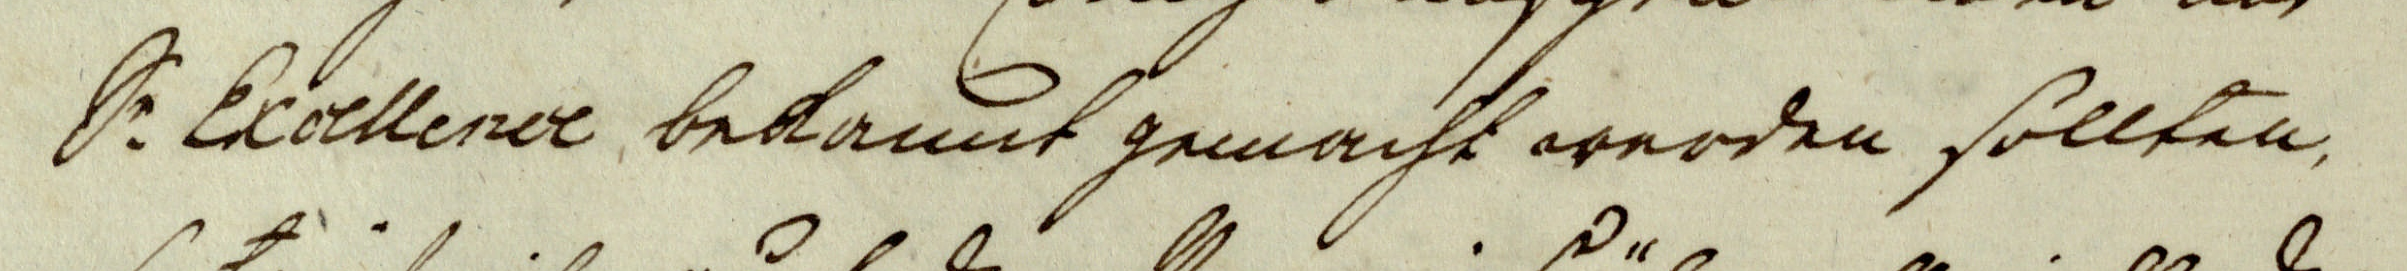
Sr. Excellence bekannt gemacht werden sollten,
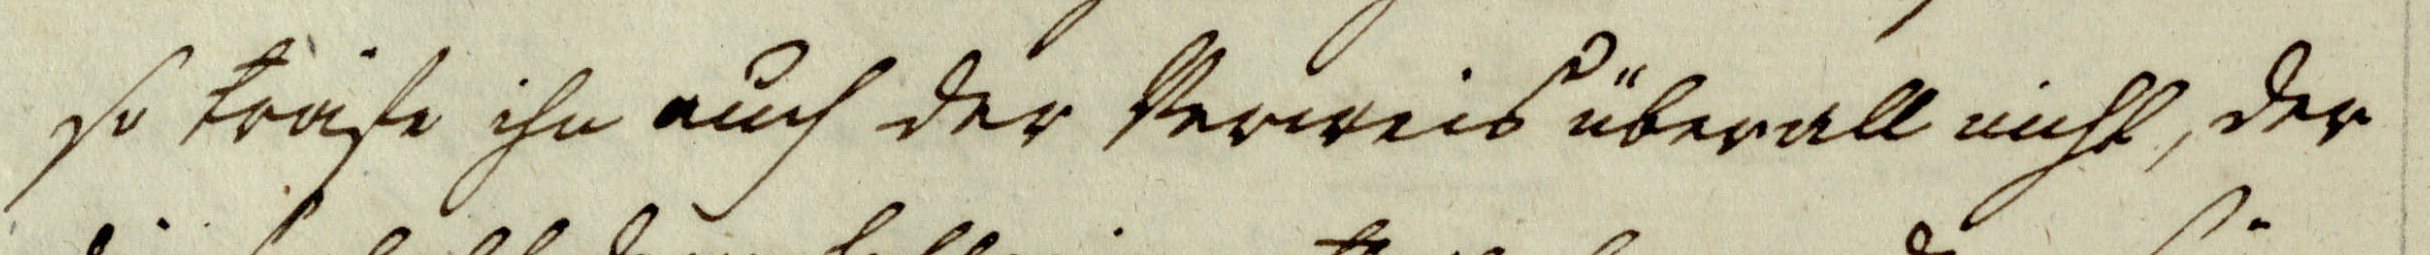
so träfe ihn auch der Verweis überall nicht, der
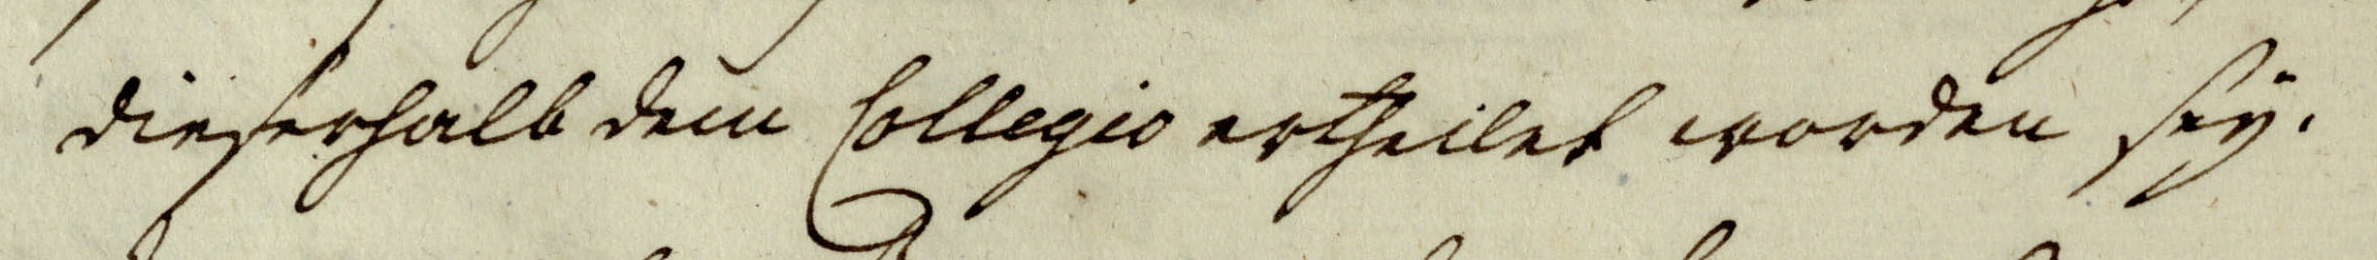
dieserhalb dem Collegio ertheilet worden seÿ.
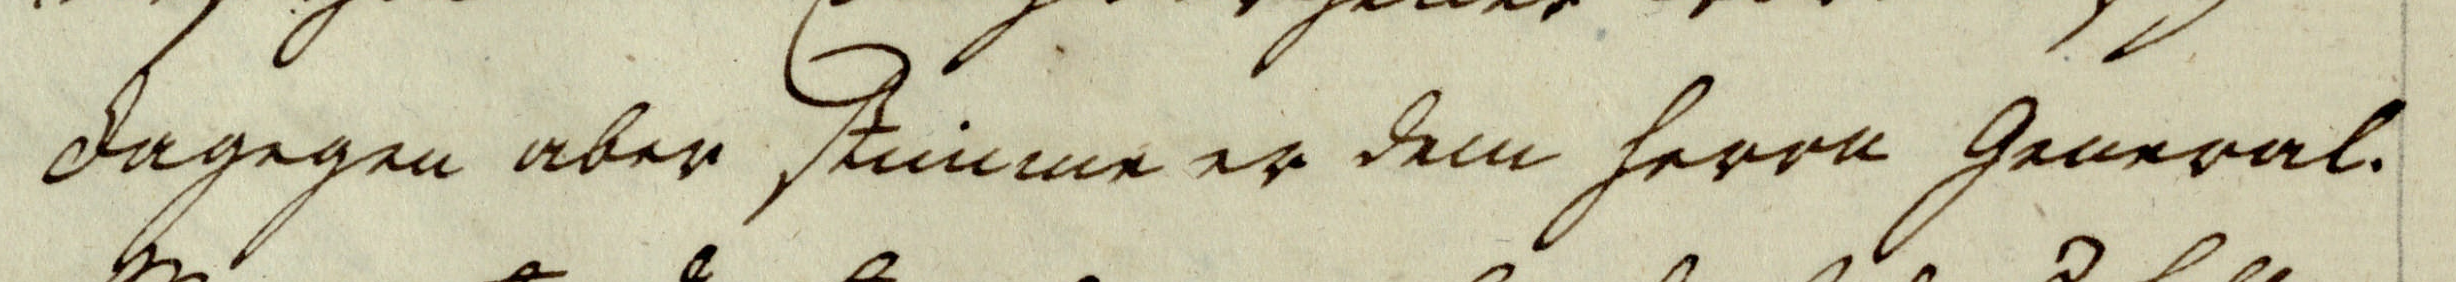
Dagegen aber Stimme er dem Herrn General¬
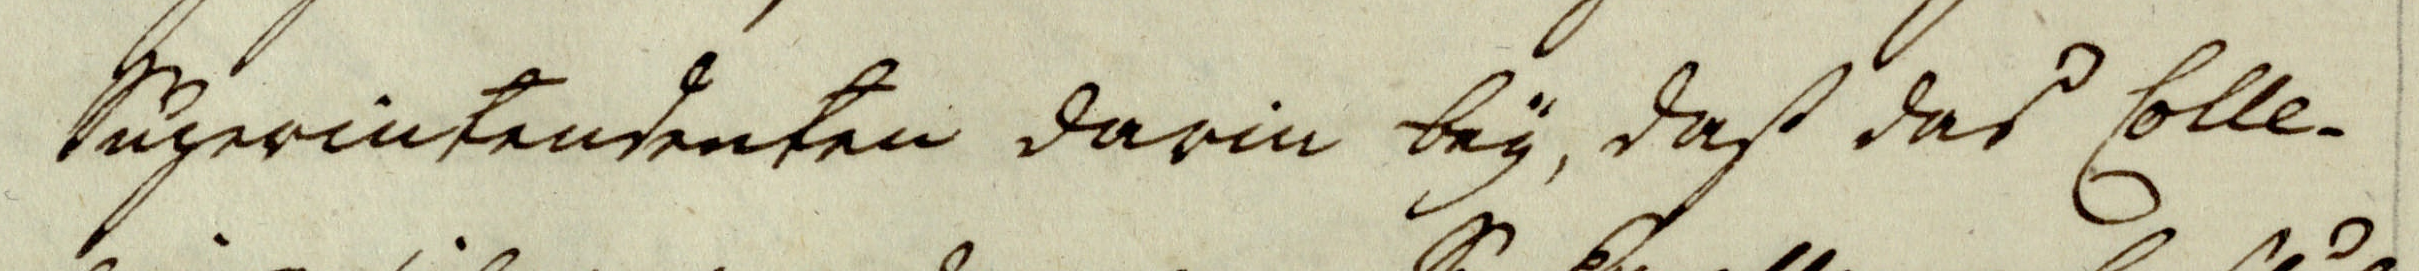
Superintendenten darin beÿ, daß das Colle¬
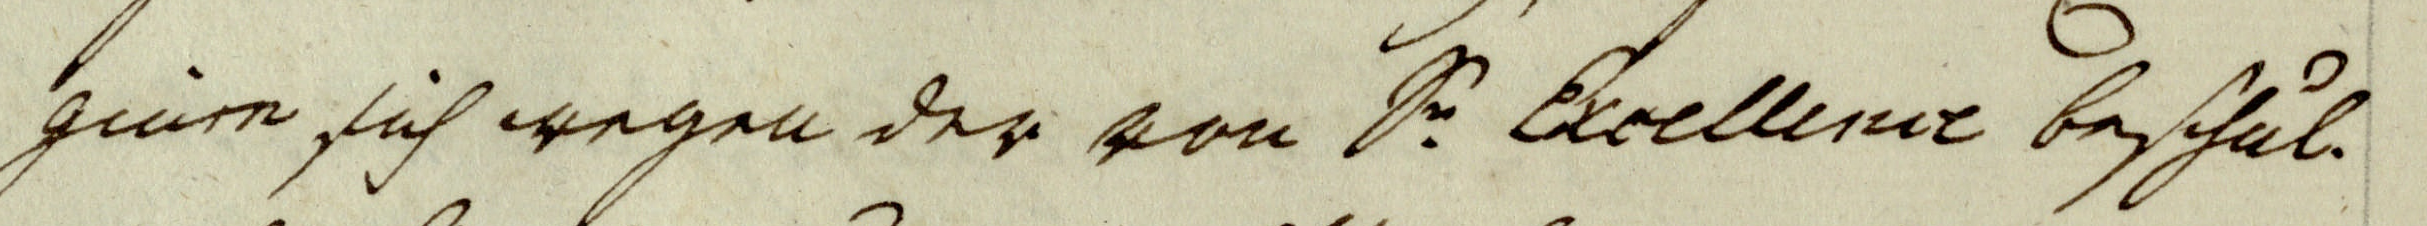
gium sich wegen der von Sr. Excellence beschul¬
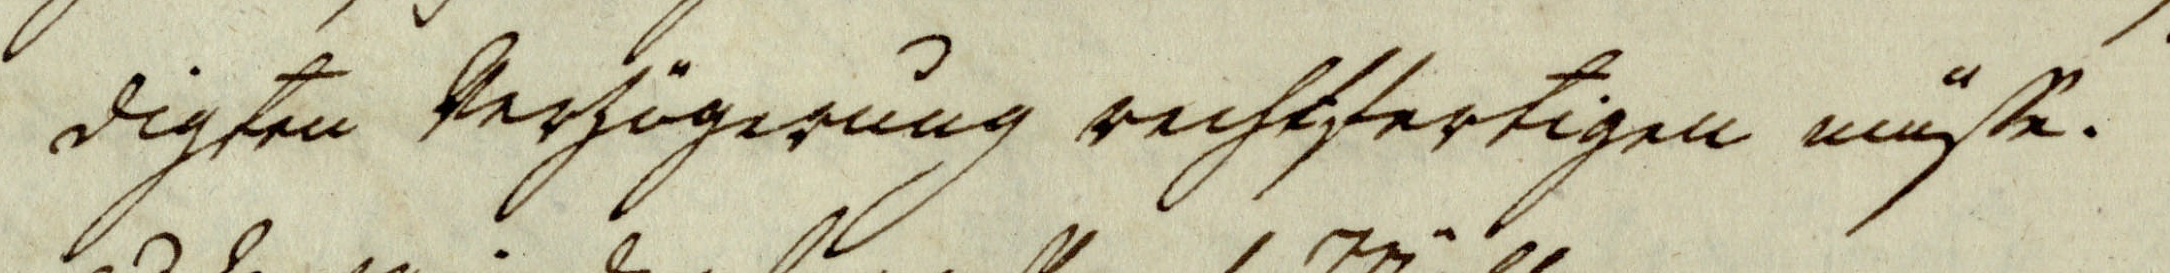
digten Verzögerung rechtfertigen müsse.
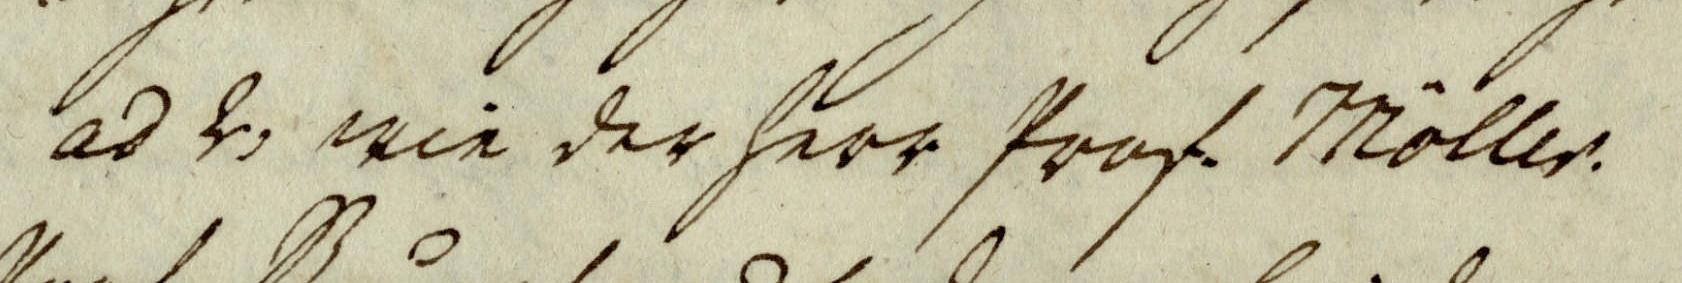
ad 2., wie der Herr Prof. Möller.
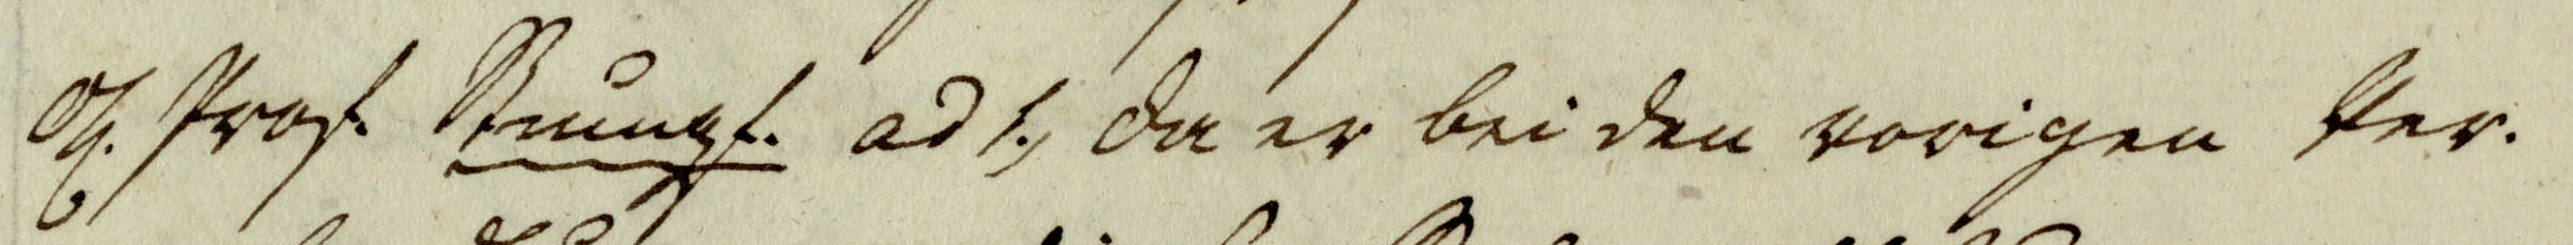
dh. Prof. Stumpf. ad 1., Da er bei den vorigen Ver¬
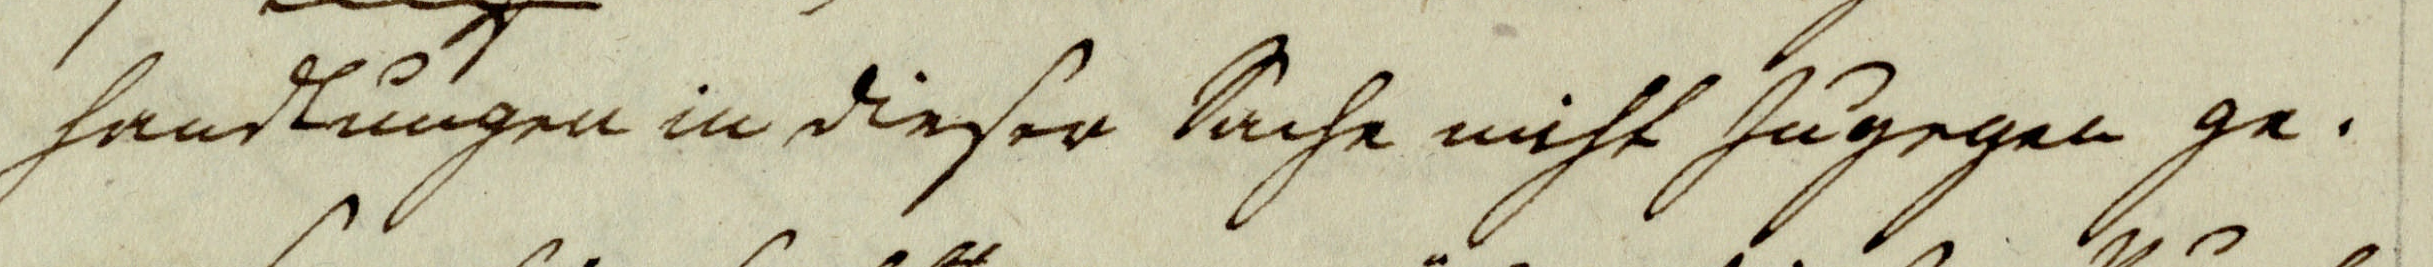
handlungen in dieser Sache nicht zugegen ge¬
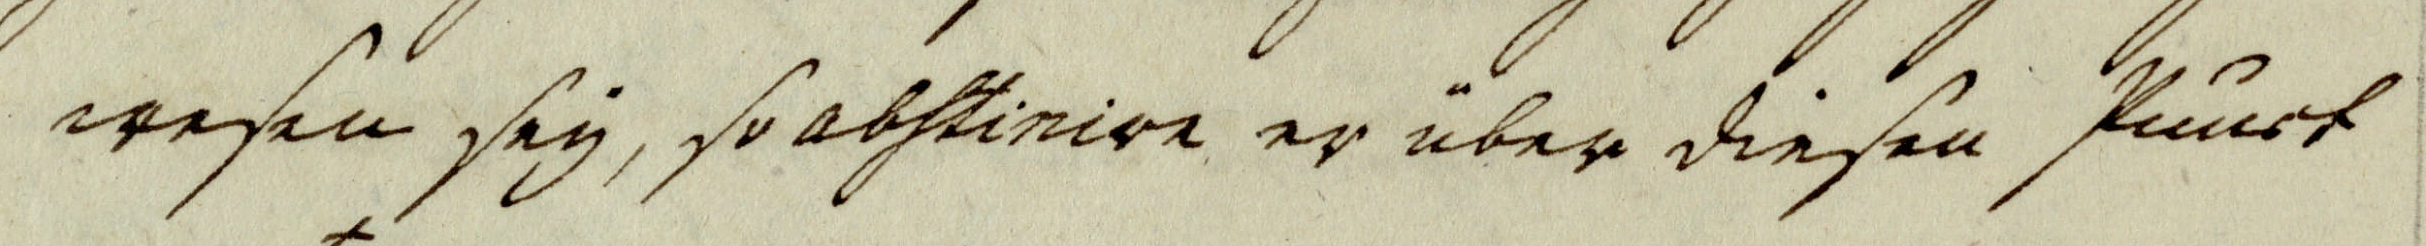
wesen seÿ, so abstinire er über diesen Punct
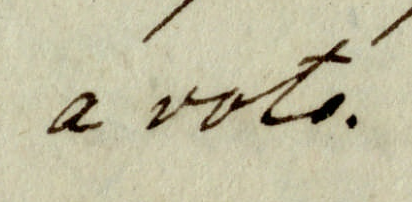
a voto.
